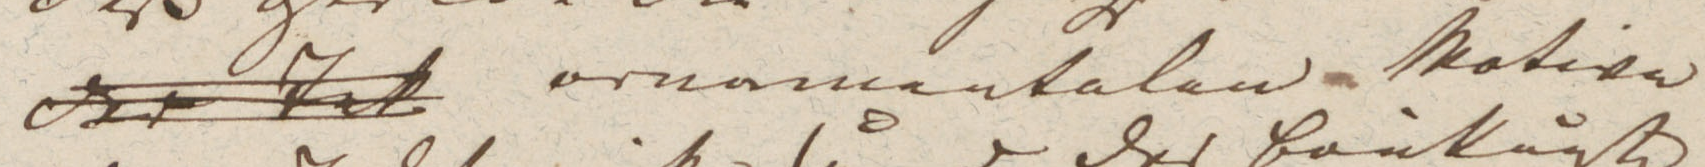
der Tek ornamentalen Motive
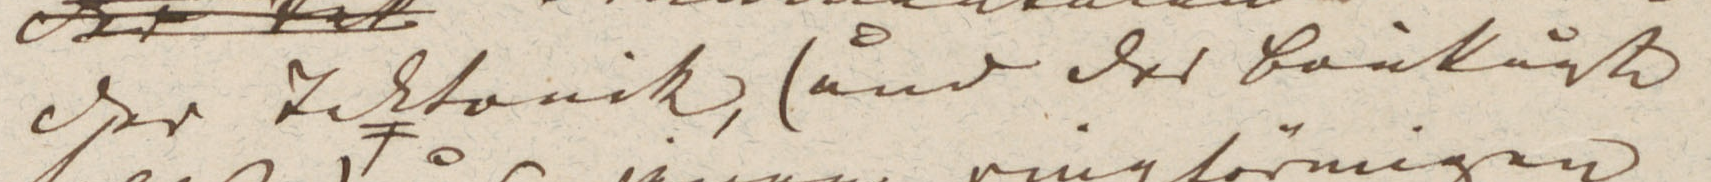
der Tektonik, (und der Baukunst
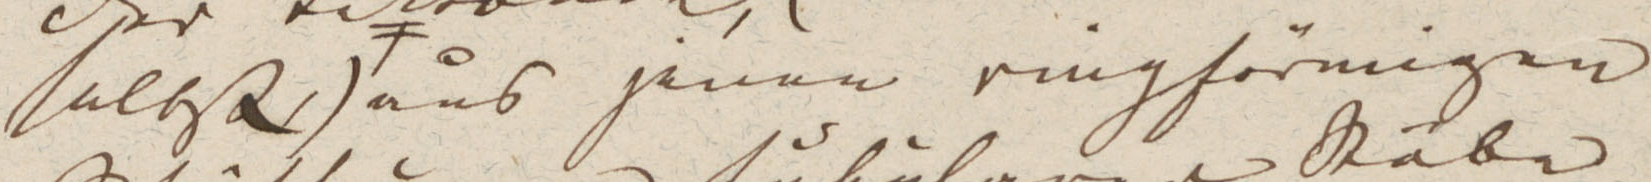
selbst,) % aus jenen ringförmigen
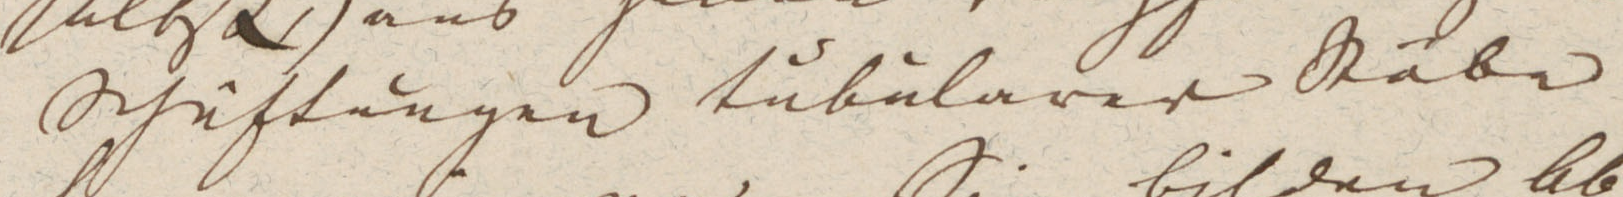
Schäftungen tubularer Stäbe
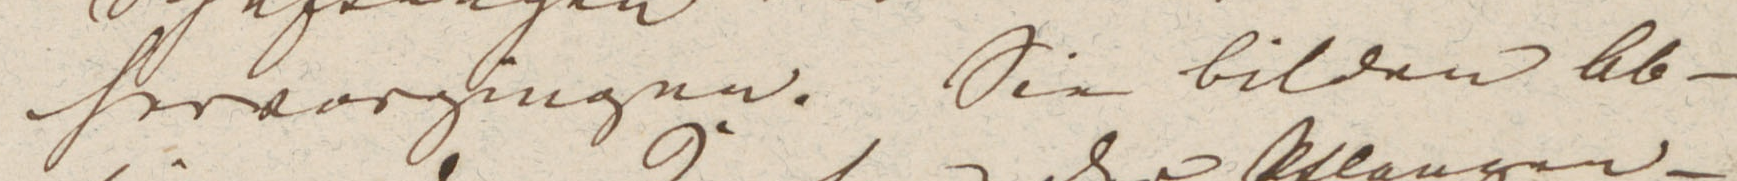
hervorgingen. Sie bilden Ab-
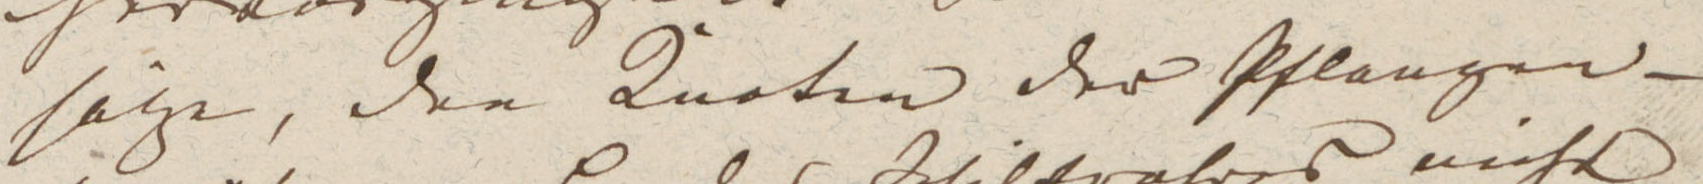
sätze, den Knoten der Pflanzen-
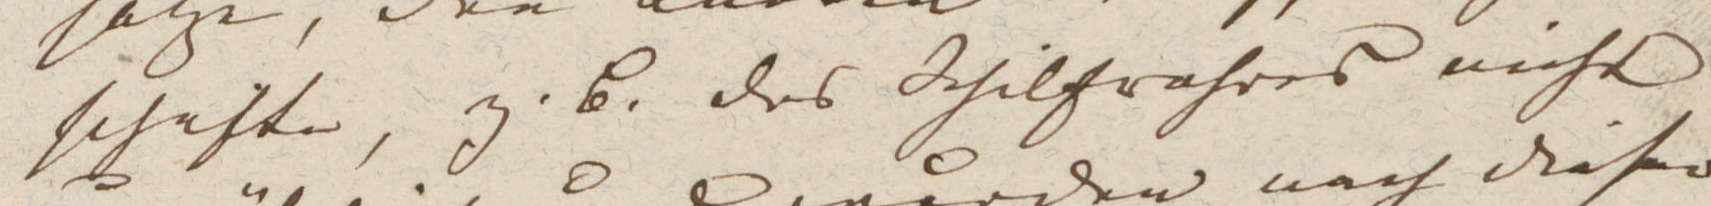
schäfte, z. B. des Schilfrohres nicht
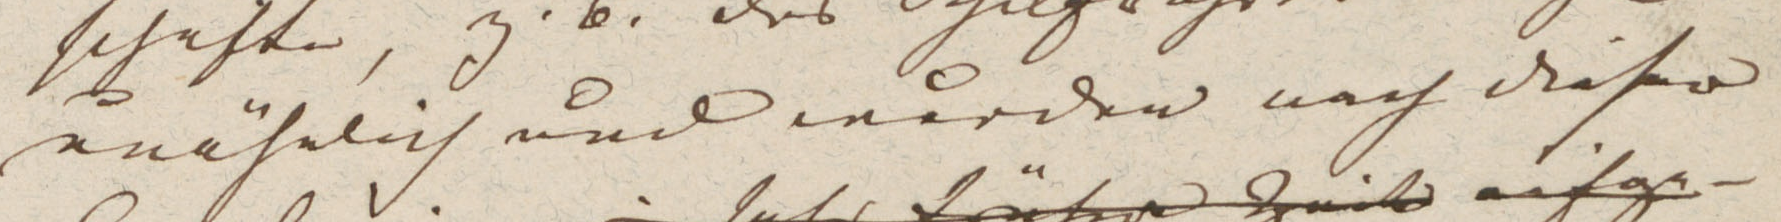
unähnlich und wurden nach dieser
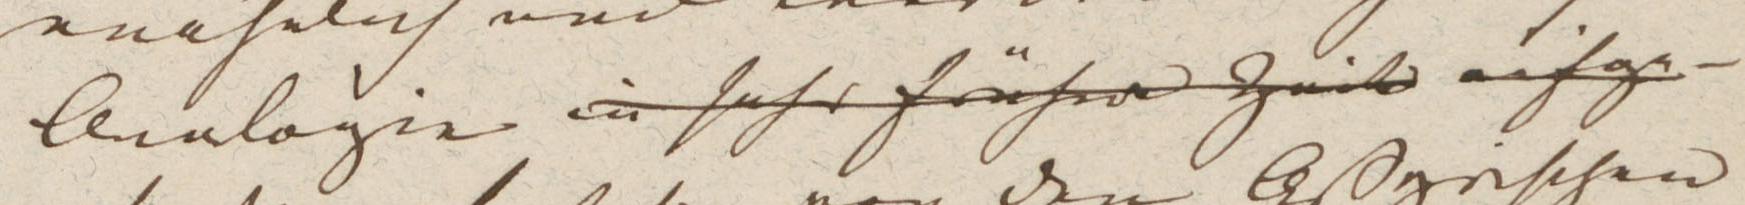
Analogie in sehr früher Zeit aufge-
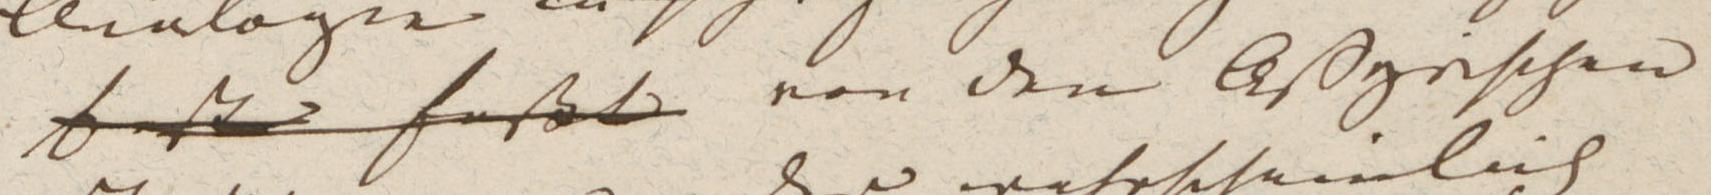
fasst fasst von den Assyrischen
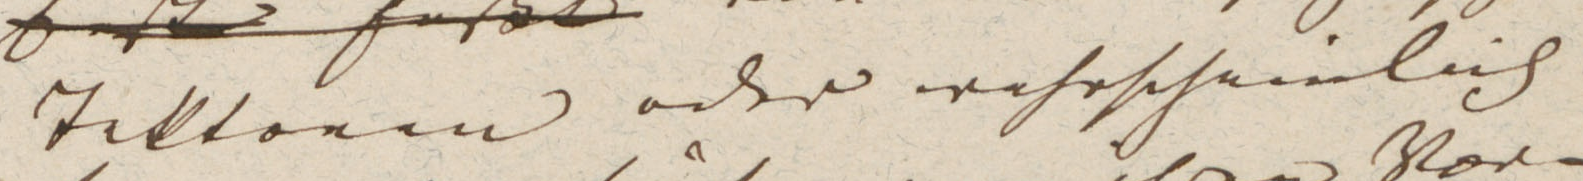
Tektonen oder wahrscheinlich
